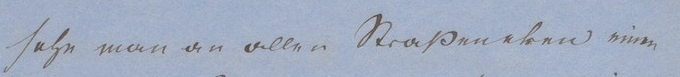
sehe man an allen Straßeneken einen
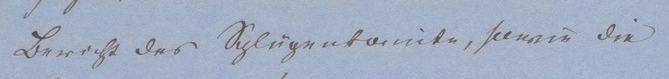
Bericht des Splügenkomite, sowie die
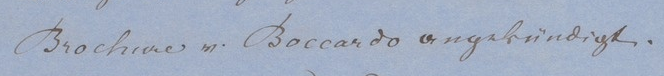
Brochure v. Boccardo angekündigt.
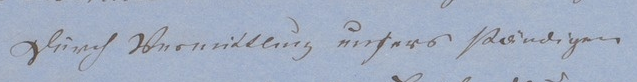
Durch Vermittlung unsers ständigen
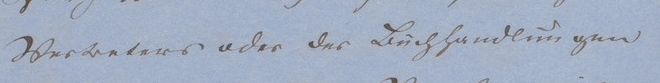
Vertreters oder der Buchhandlungen
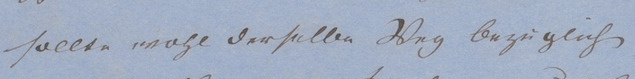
sollte wohl derselbe Weg bezüglich
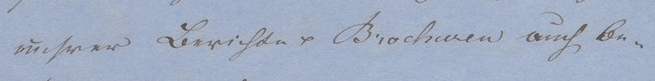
unsrer Berichten & Brochuren auch be-
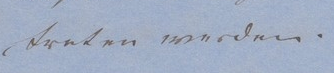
treten werden. –
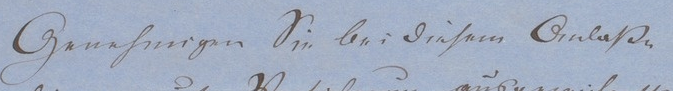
Genehmigen Sie bei diesem Anlaße
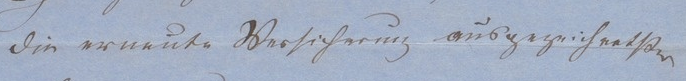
die erneute Versicherung ausgezeichnetster
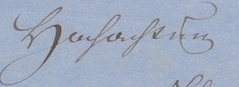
Hochachtung
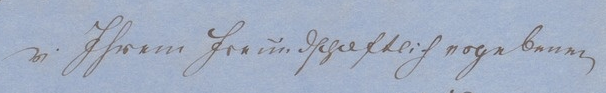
v. Ihrem freundschaftlich ergebenen
